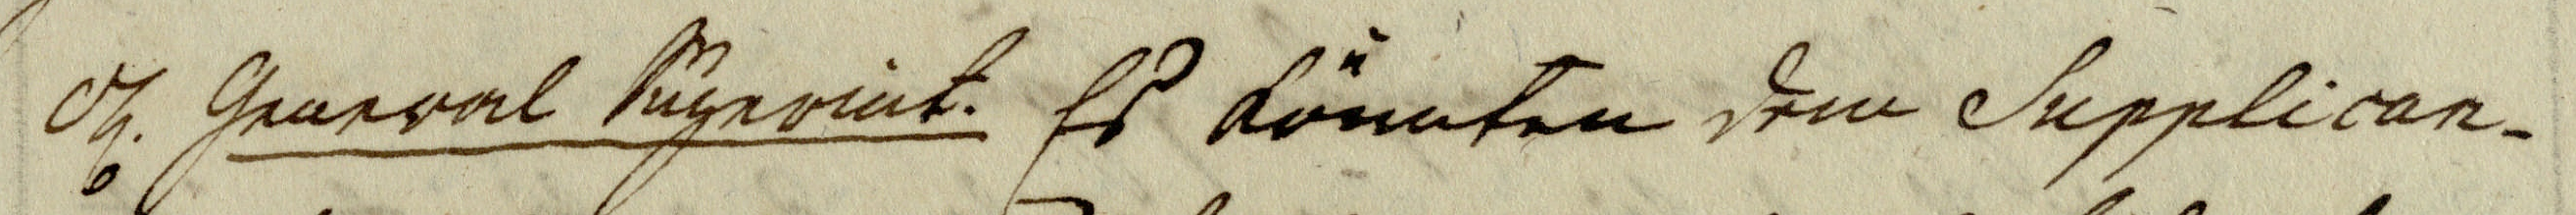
dh. General Superint. Es könnten dem Supplican¬
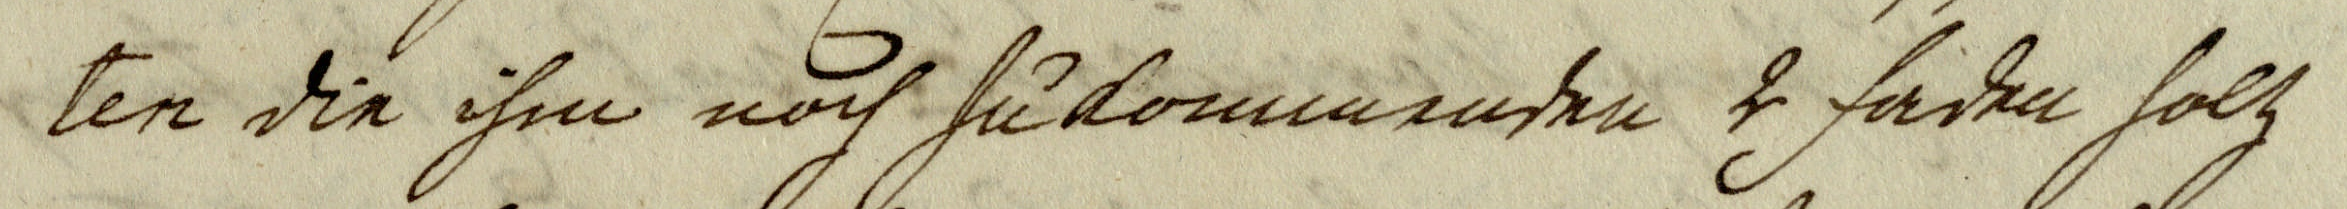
ten die ihm noch zukommenden 2 Faden Holz
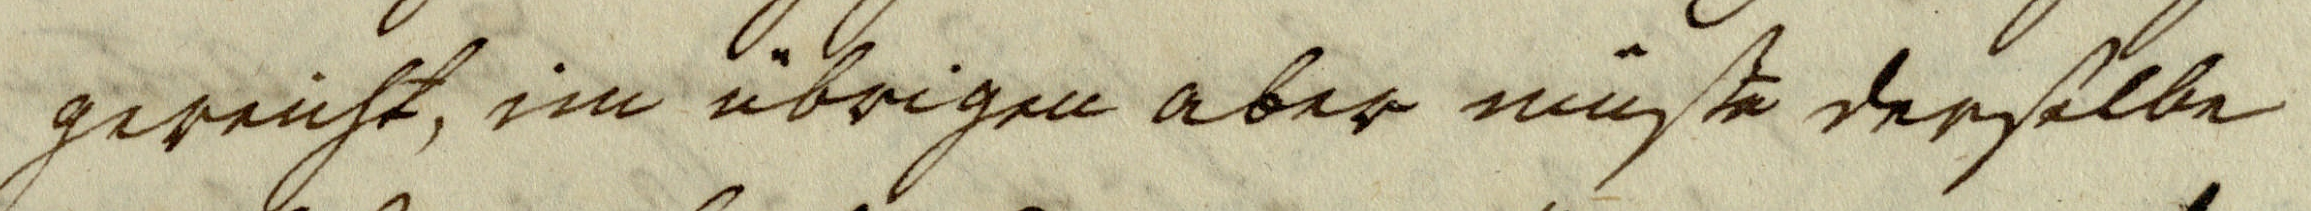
gereicht, im übrigen aber müsste derselbe
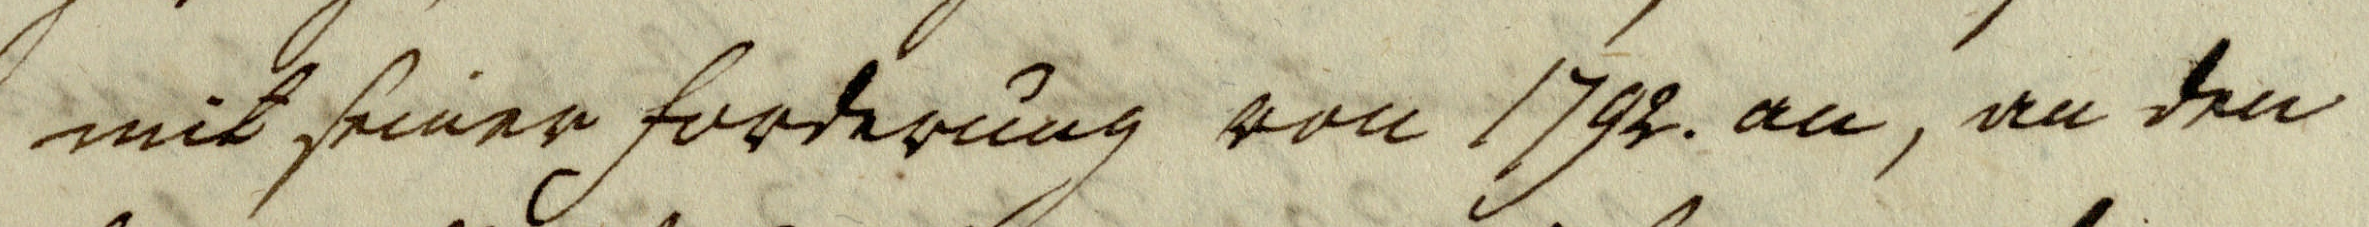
mit seiner Forderung von 1792. an, an den
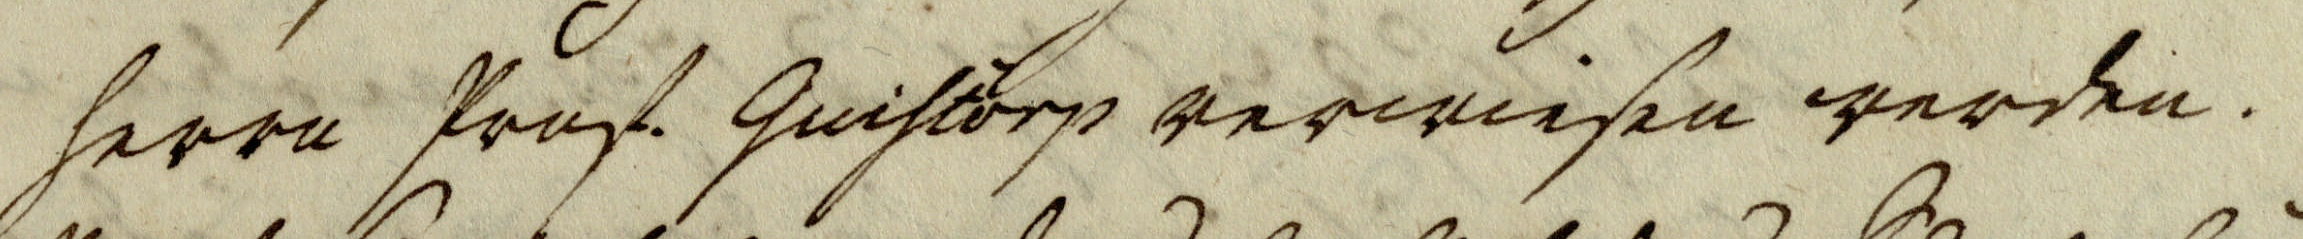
Herrn Prof. Quistorp verwiesen werden.
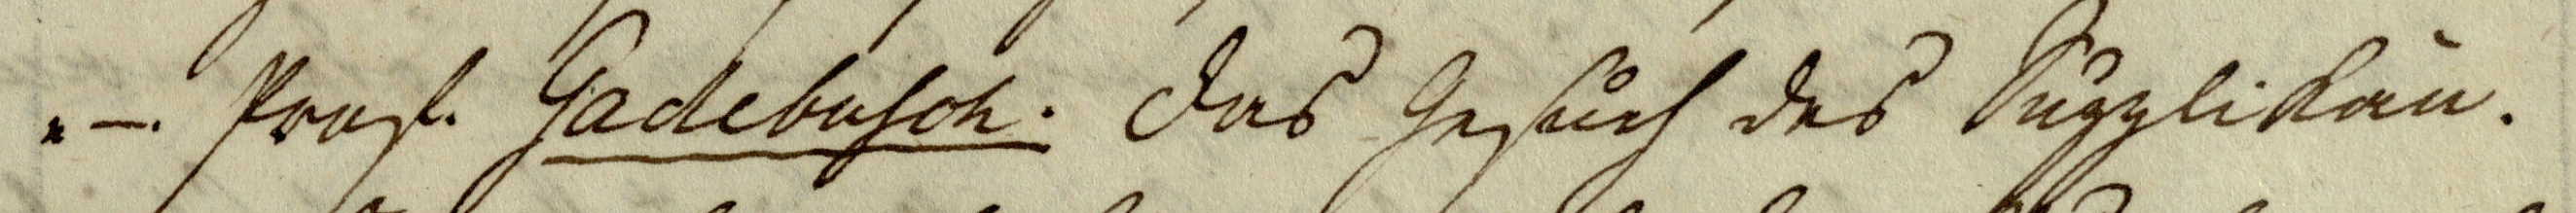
" — . Prof. Gadebusch. Das Gesuch des Supplikan¬
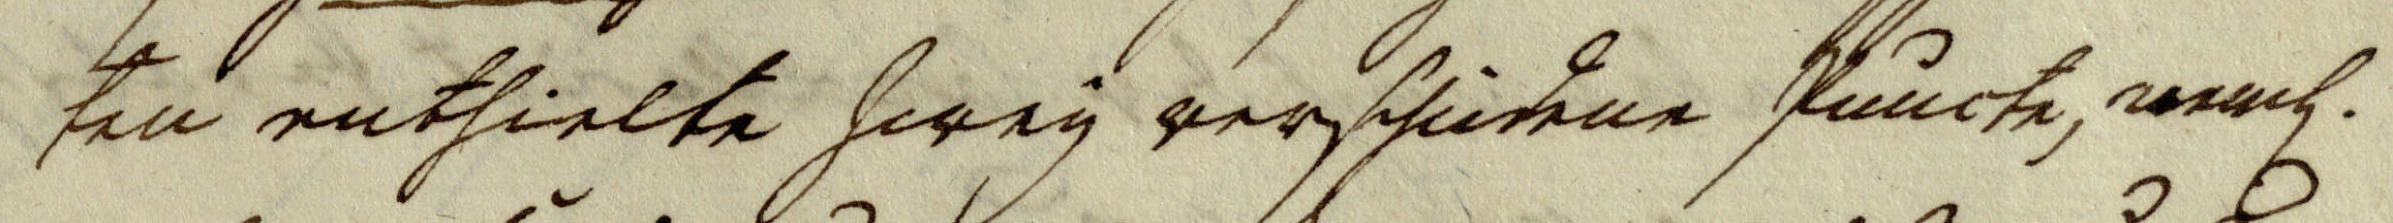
ten enthielte zweÿ verschiedene Puncte, neml.
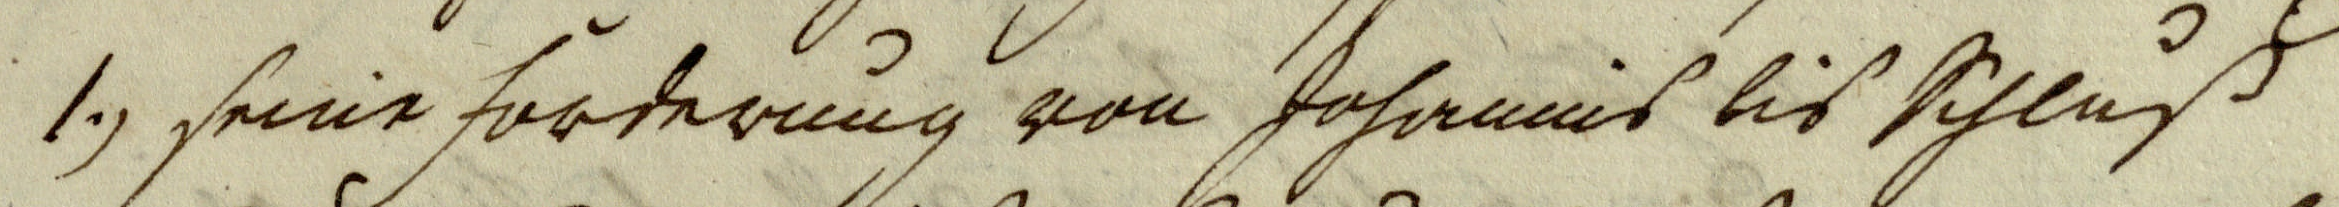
1., seine Forderung von Johannis bis Schluß
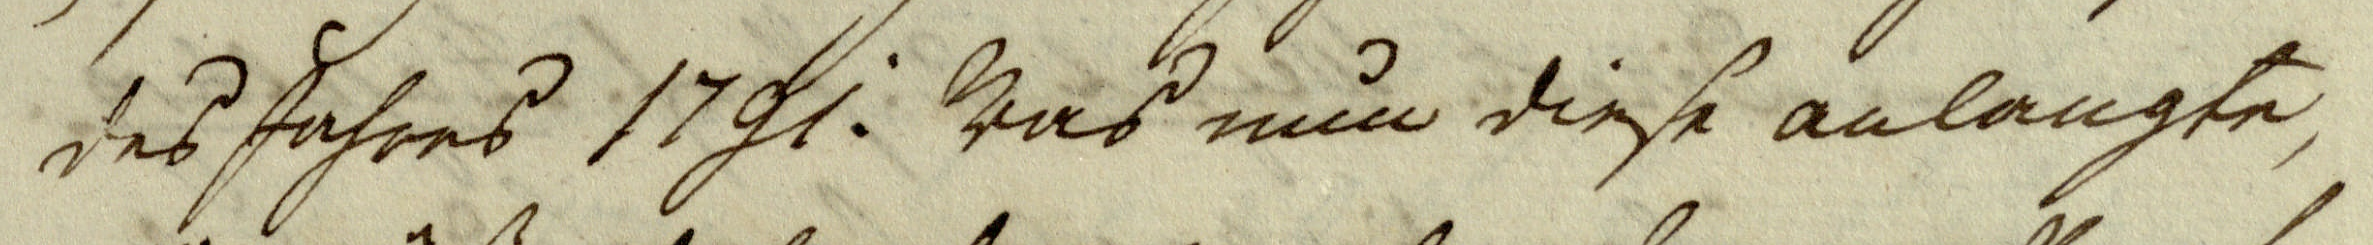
des Jahres 1791. Was nun diese anlangte,
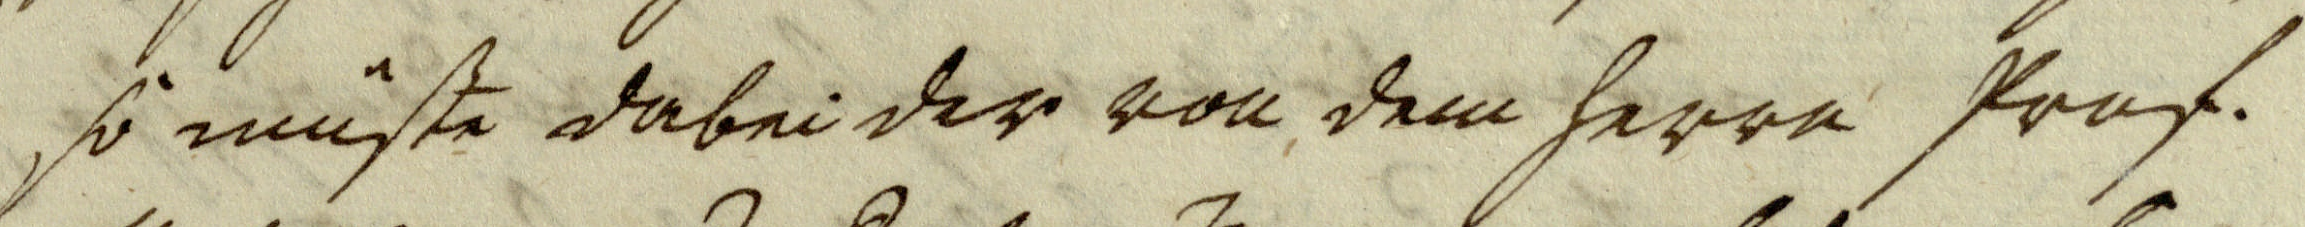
so müßte dabei der von dem Herrn Prof.
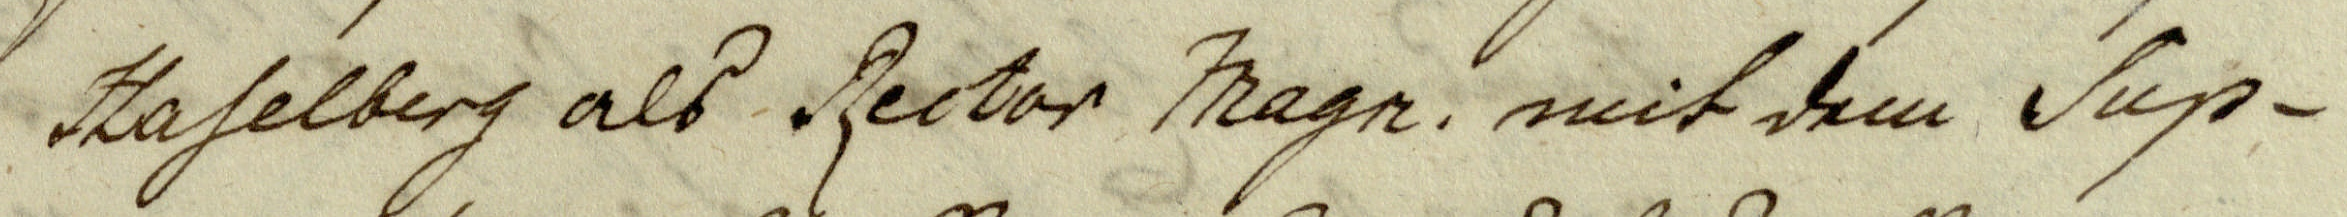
Haselberg als Rector Magn. mit dem Sup¬
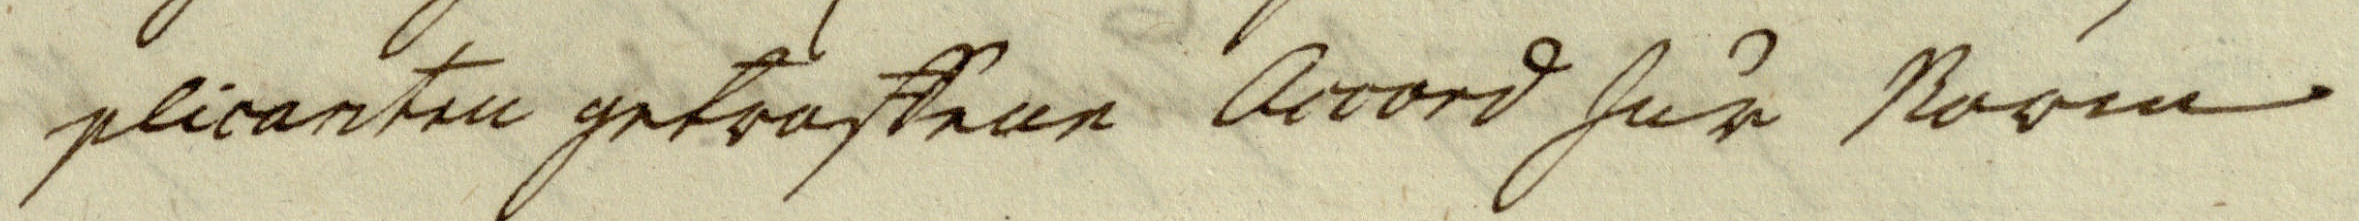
plicanten getroffene Accord zur Norm
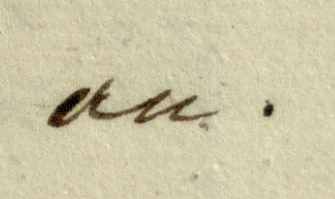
an¬
